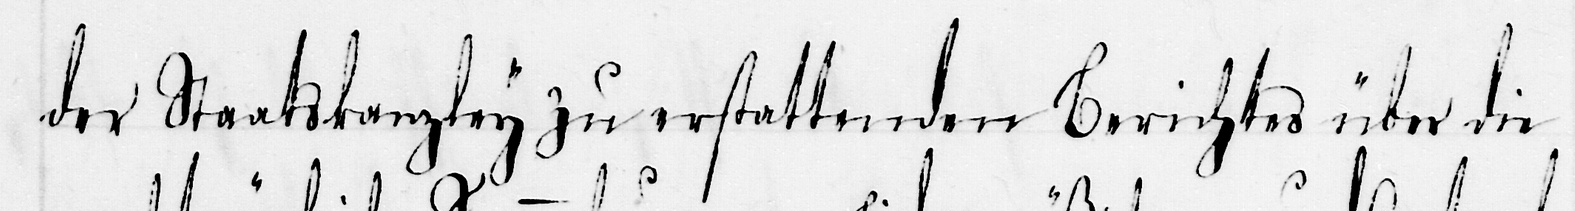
der Staatskanzley zu erstattenden Berichtes über die
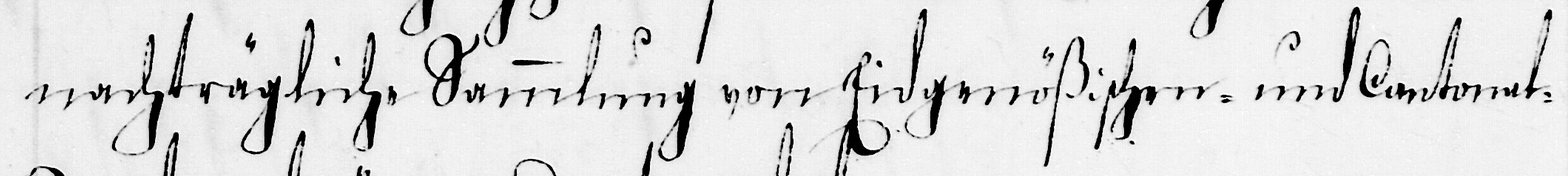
nachträgliche Sammlung von Eidgenößischen- und Cantona¬
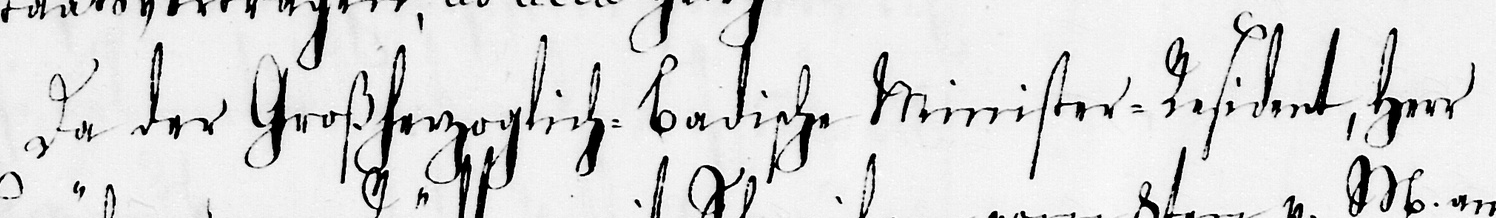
Da der Großherzoglich-Badische Minister-Resident, Her¬
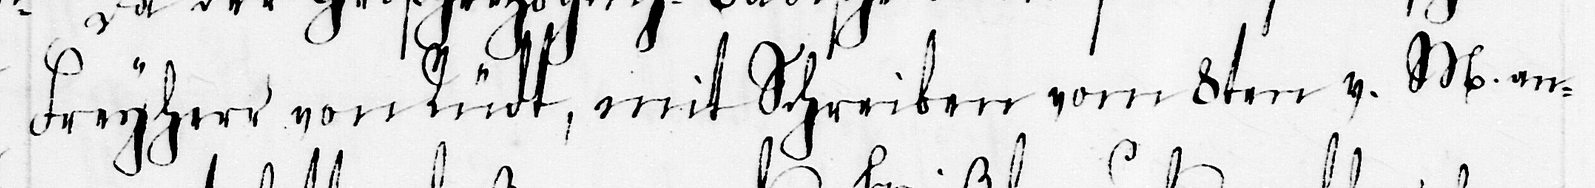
Freyherr von Rüdt, mit Schreiben vom 8ten v. M. an¬
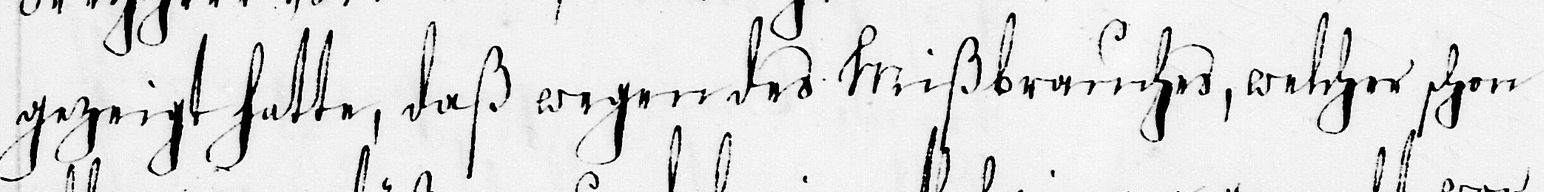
gezeigt hatte, daß wegen des Mißbrauches, welcher schon
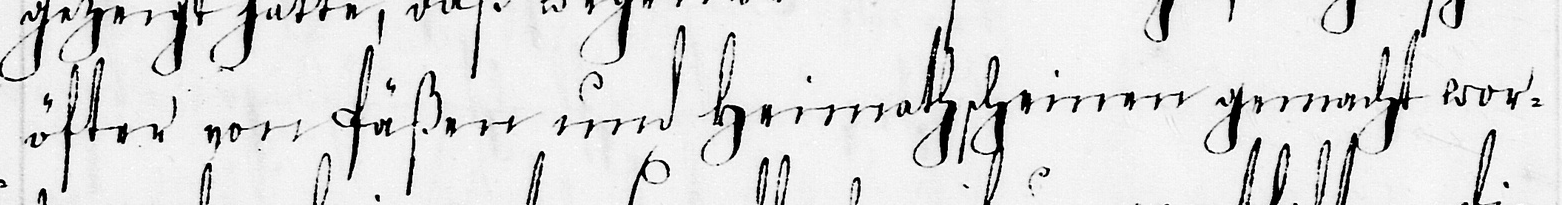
öfter von Päßen und Heimathscheinen gemacht wor¬
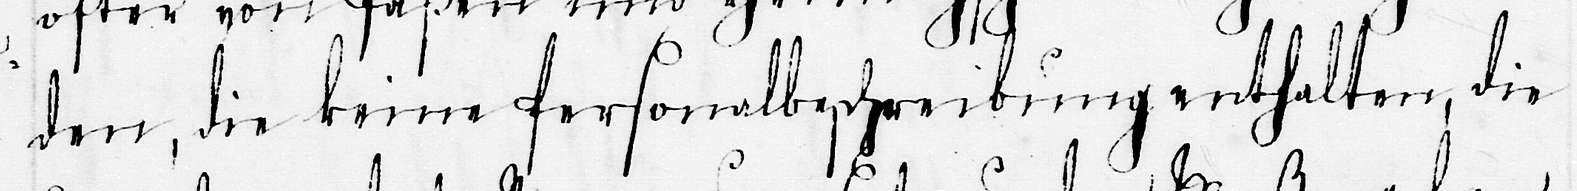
den, die keine Personalbeschreibung enthalten, die
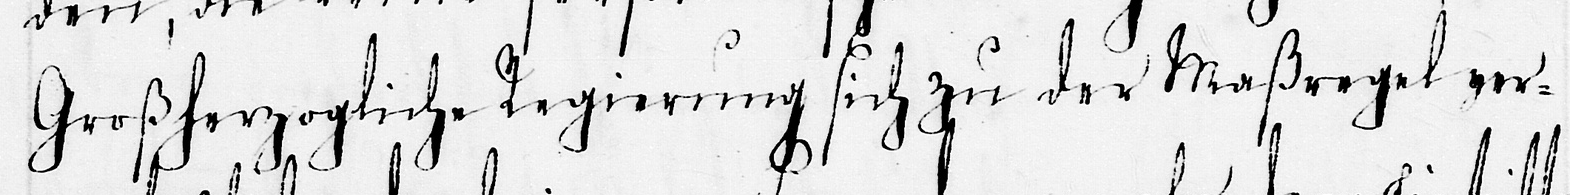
Großherzogliche Regierung sich zu der Maßregel ver¬
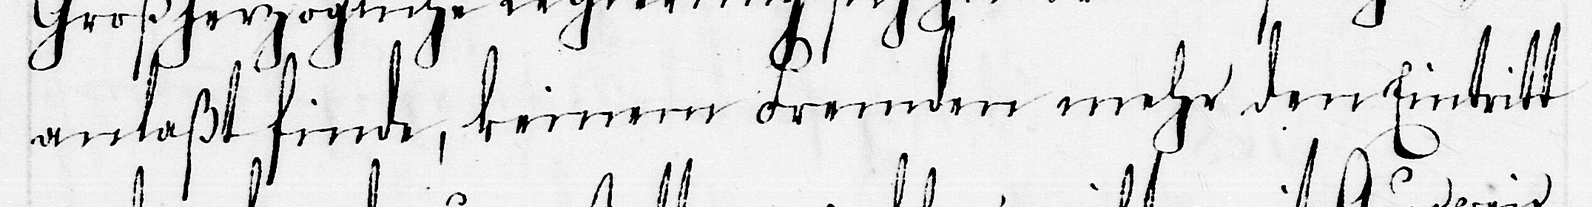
anlaßt finde, keinem Fremden mehr den Eintritt
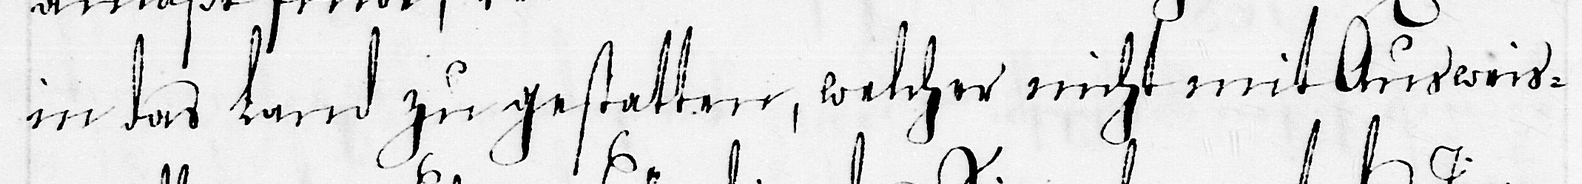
in das Land zu gestatten, welcher nicht mit Ausweis¬
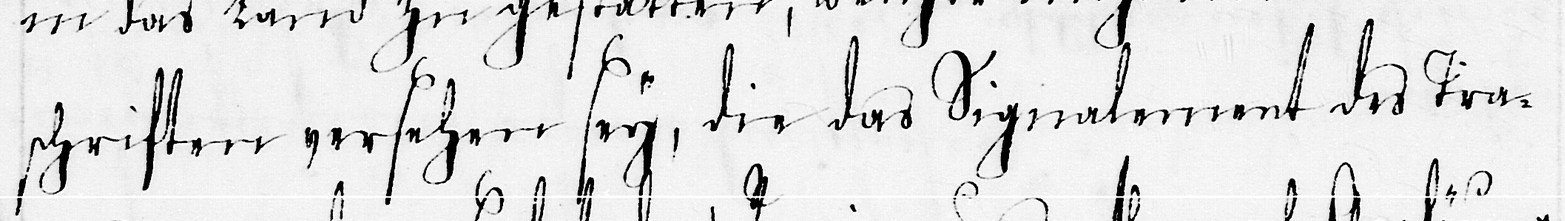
schriften versehen sey, die das Signalement des Tra¬
